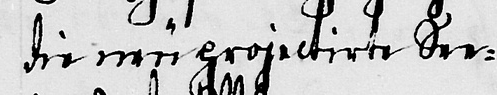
die neu projectirte Seestr¬
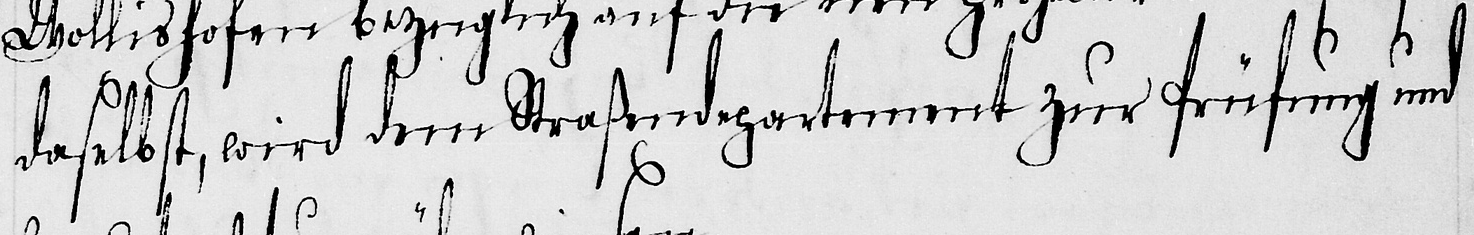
daselbst, wird dem Straßendepartement zur Prüfung und
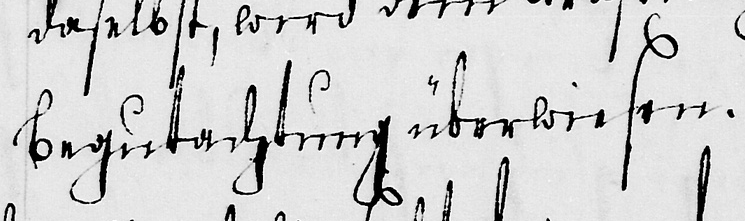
Begutachtung überwiesen.
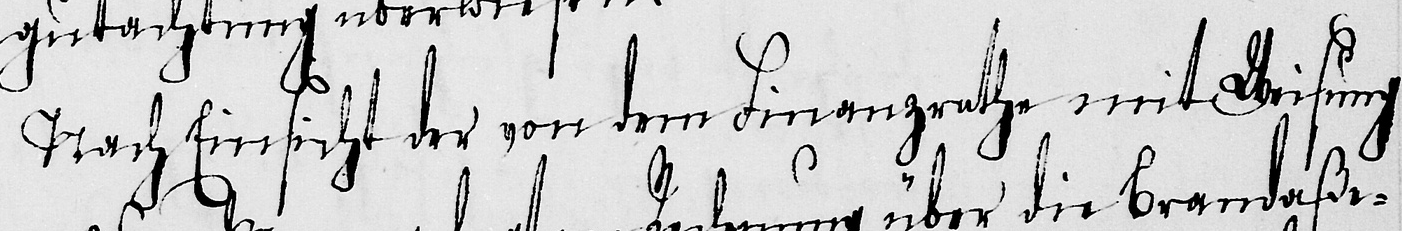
Nach Einsicht der von dem Finanzrathe mit Weisung
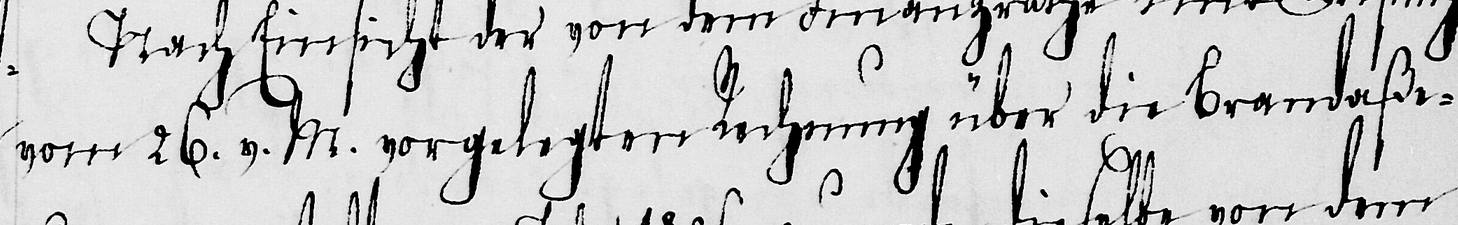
vom 26. v. M. vorgelegten Rechnung über die Brandaße¬
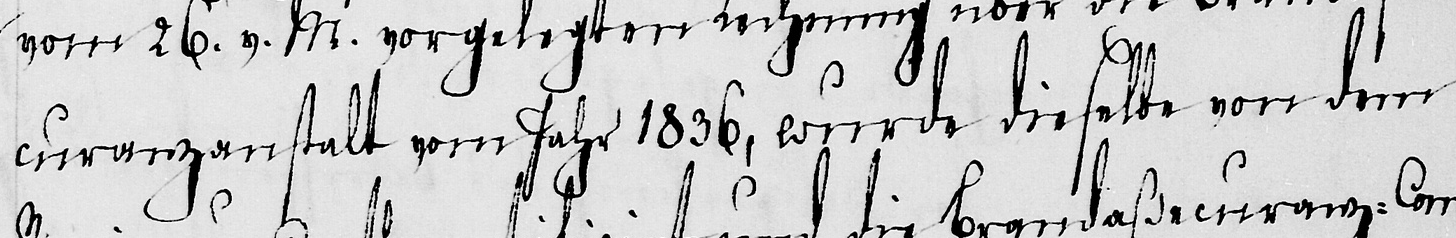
curanzanstalt vom Jahr 1836, wurde dieselbe von dem
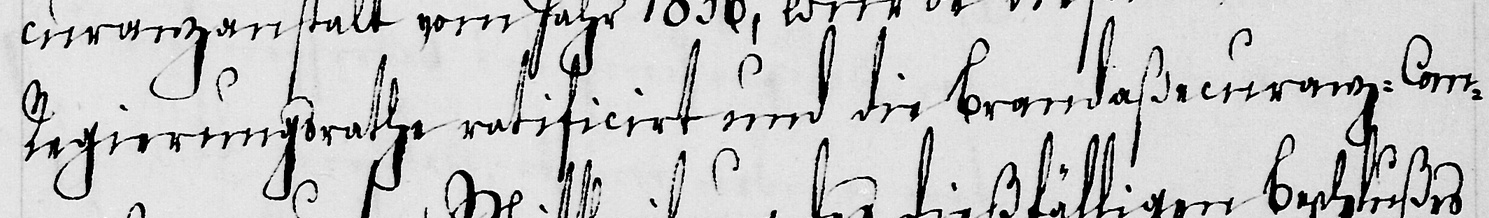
Regierungsrathe ratificirt und die Brandaßecuranz-Com¬
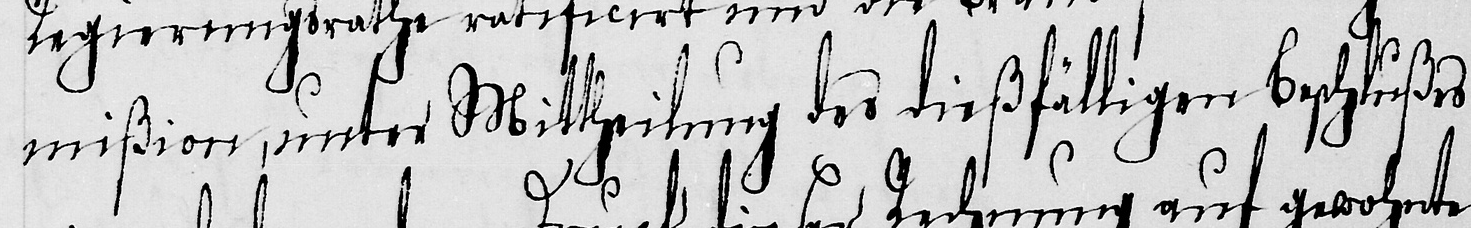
mißion, unter Mittheilung des dießfälligen Beschlußes
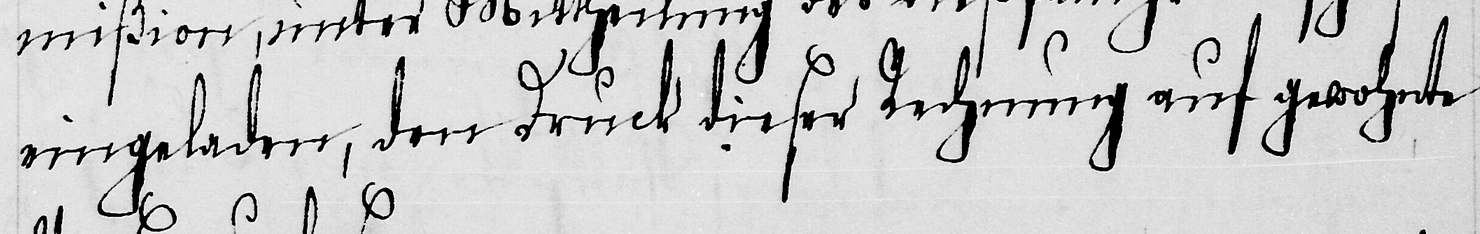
eingeladen, den Druck dieser Rechnung auf gewohnte
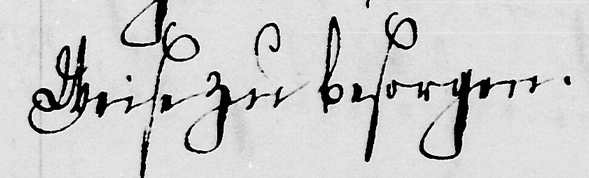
Weise zu besorgen.
